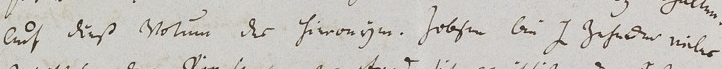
Auf dieß Votum des Hieronym. Jobsen bei H. Zehender vieles
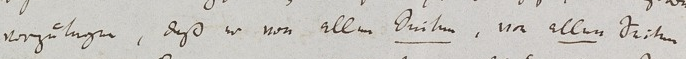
vorzulegen, daß er von allen Seiten, von allen Seiten
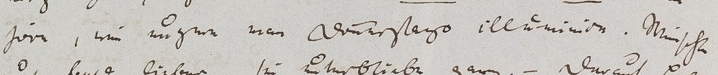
höre, wie ungern man Donnerstags illuminire. Wünschte
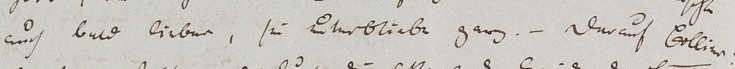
auch bald lieber, sie unterbliebe ganz. – Darauf Bollier:
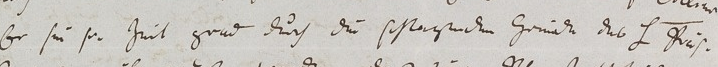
Er sei sr. Zeit grad durch die schlagenden Gründe des H. Präs.
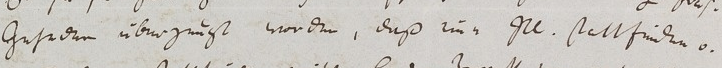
Zehnder überzeugt worden, daß eine Ill. stattfinden &.
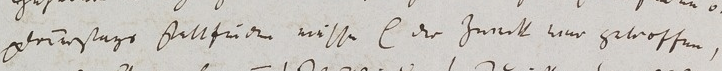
Donnerstags stattfinden müsse (der Zweck war getroffen,
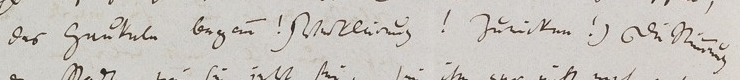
das Gaukeln begann! Verklärung! Zunicken!) Die Stimmung
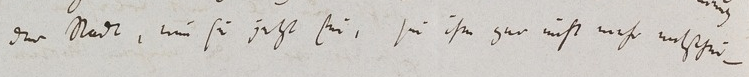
der Stadt, wie sie jetzt sei, sei ihm gar nicht mehr entschei-
